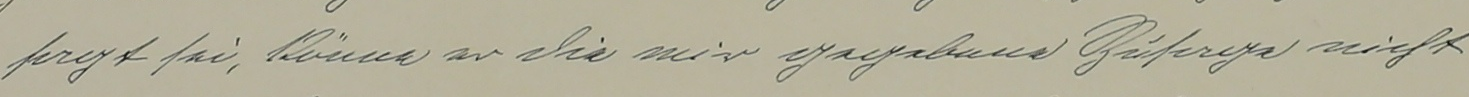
sagt sei, könne er die mir gegebene Zusage nicht
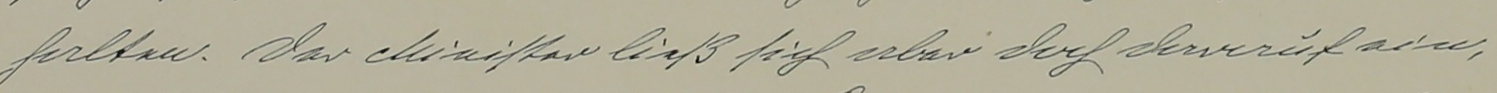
halten. Der Minister ließ sich aber doch darauf ein,
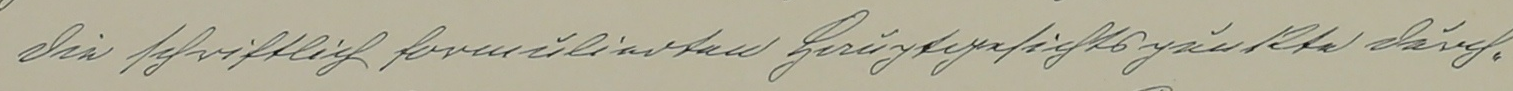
die schriftlich formulierten Hauptgesichtspunkte durch-
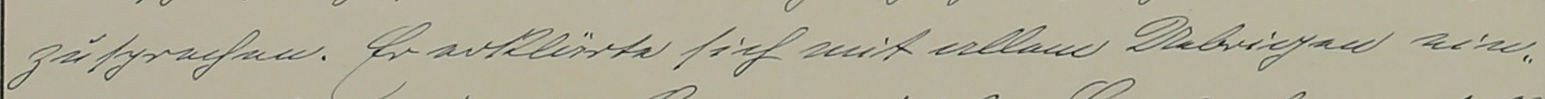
zusprechen. Er erklärte sich mit allem Uebrigen ein-
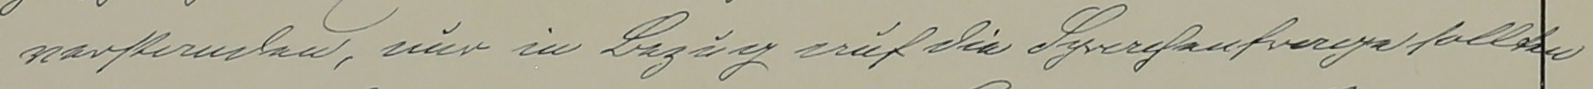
verstanden, nur in Bezug auf die Sprachenfrage sollten
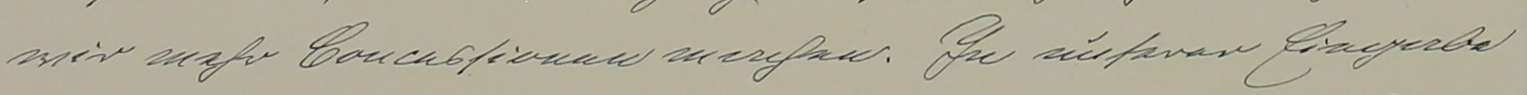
wir mehr Concessionen machen. In unserer Eingabe
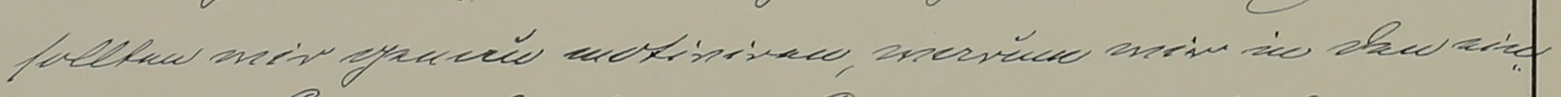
sollten wir genau motiviren, warum wir in den ein-
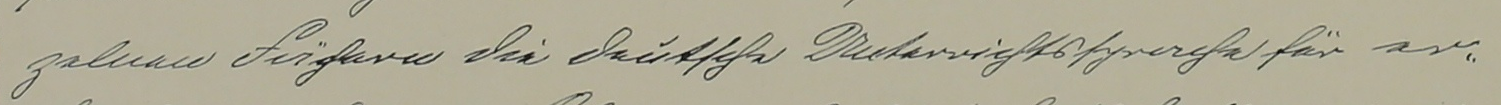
zelnen Fächern die deutsche Unterrichtssprache für er-
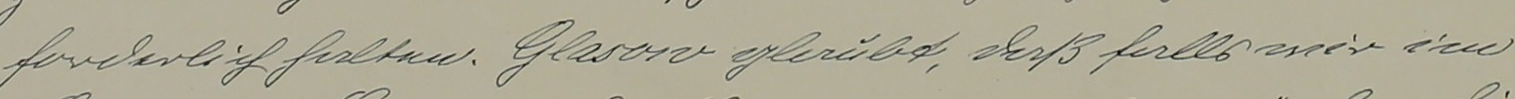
forderlich halten. Glasow glaubt, daß falls wir im
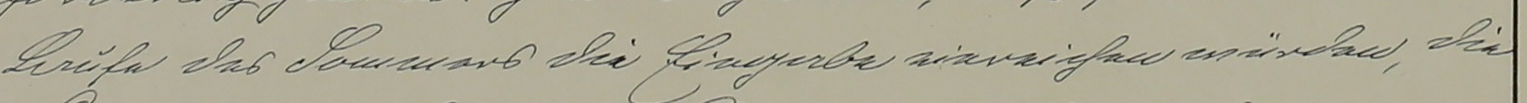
Laufe des Sommers die Eingabe einreichen würden, die
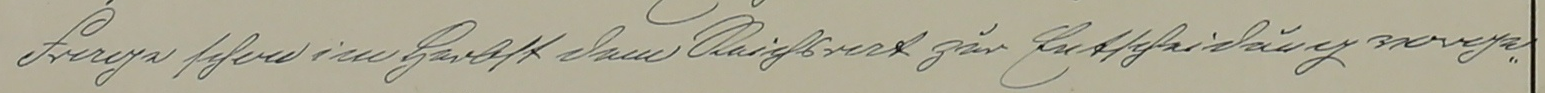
Frage schon im Herbst dem Reichsrat zur Entscheidung vorge-
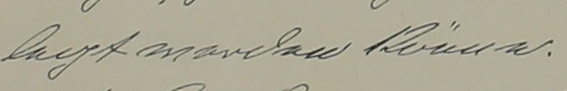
legt werden könne.
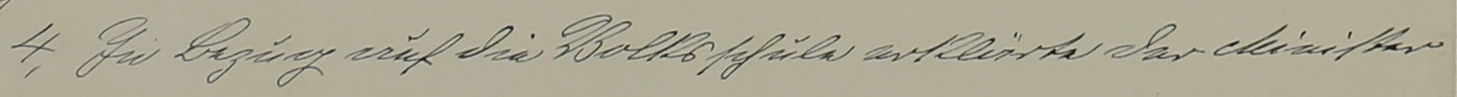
4. In Bezug auf die Volksschule erklärte der Minister
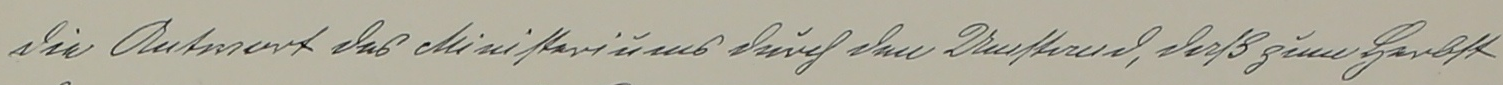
die Antwort des Ministeriums durch den Umstand, daß zum Herbst
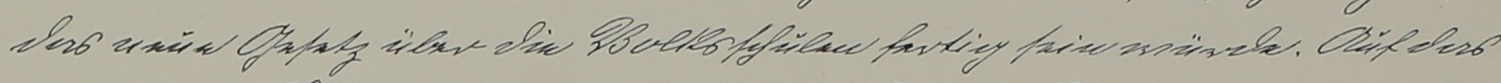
das neue Gesetz über die Volksschulen fertig sein würde. Auf das
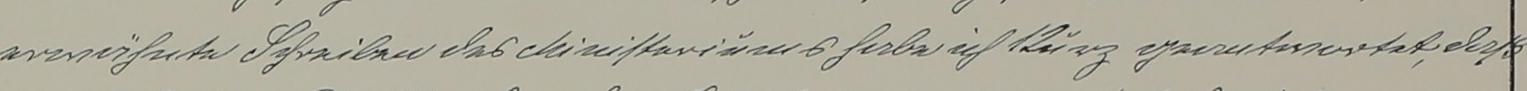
erwähnte Schreiben des Ministeriums habe ich kurz geantwortet, daß
